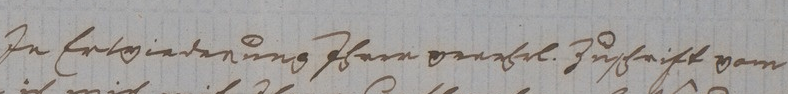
In Erwiederung Ihrer verehrl. Zuschrift vom
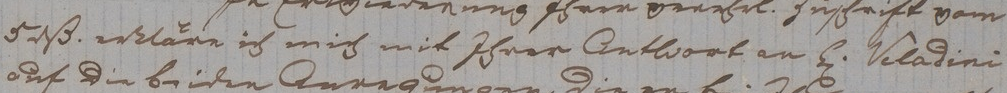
5 dß. erkläre ich mich mit Ihrer Antwort an H. Veladini
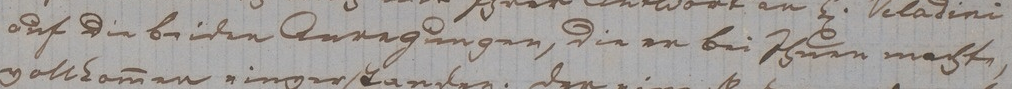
auf die beiden Anregungen, die er bei Ihnen machte,
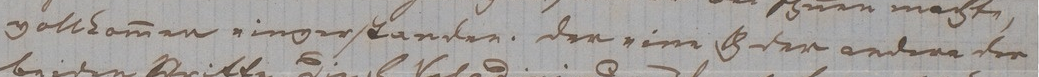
vollkommen einverstanden. Der eine & der andere der
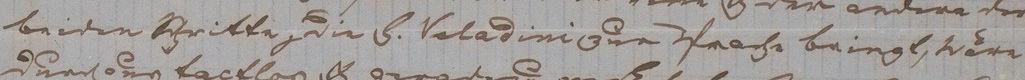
beiden Schritte, die H. Veladini zur Sprache bringt, wäre
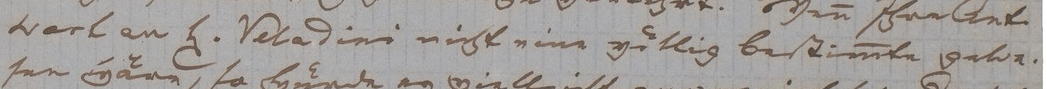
wort an H. Veladini nicht eine völlig bestimmte gewe-
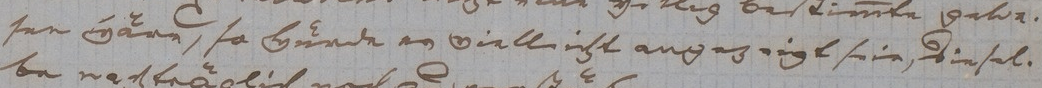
sen wäre, so würde es vielleicht angezeigt sein, diesel-
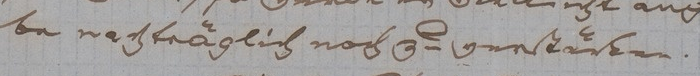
be nachträglich noch zu verstärken.
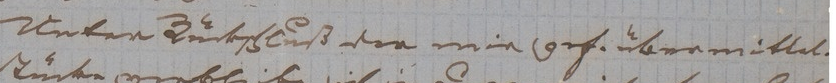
Unter Rückschluß der mir gef. übermittel-
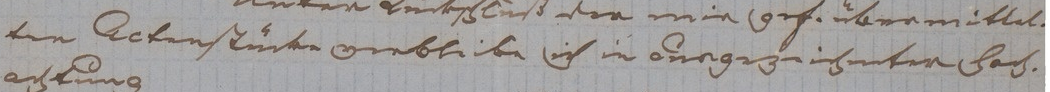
ten Actenstücke verbleibe ich in ausgezeichneter Hoch-
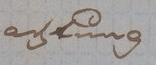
achtung
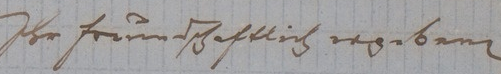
Ihr freundschaftlich ergebene
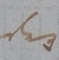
Bern
